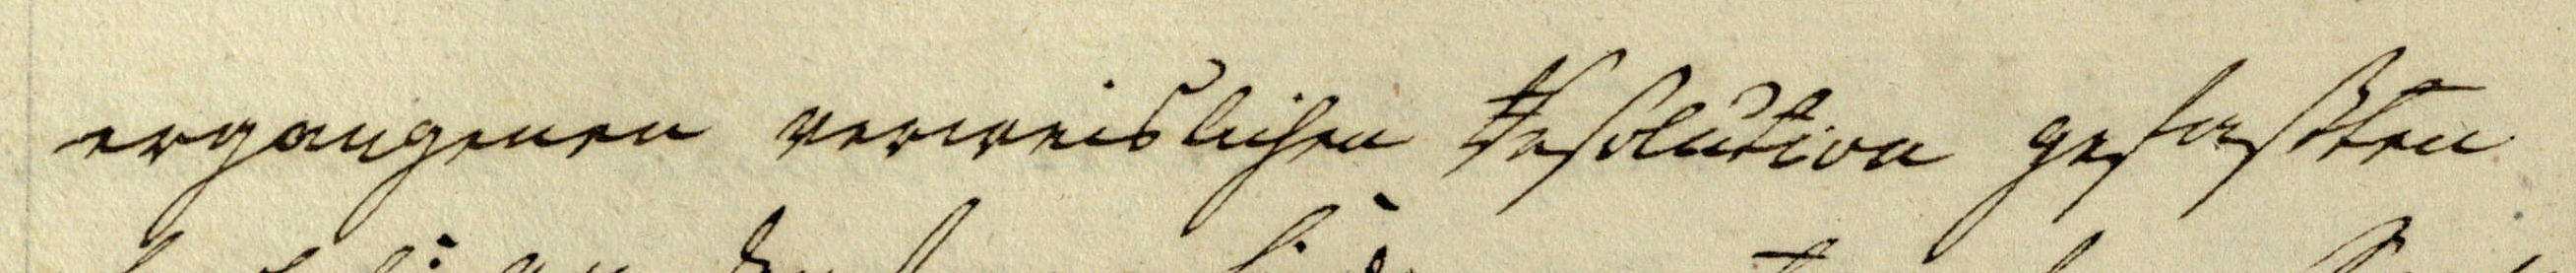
ergangenen verweislichen Resolution gefaßten
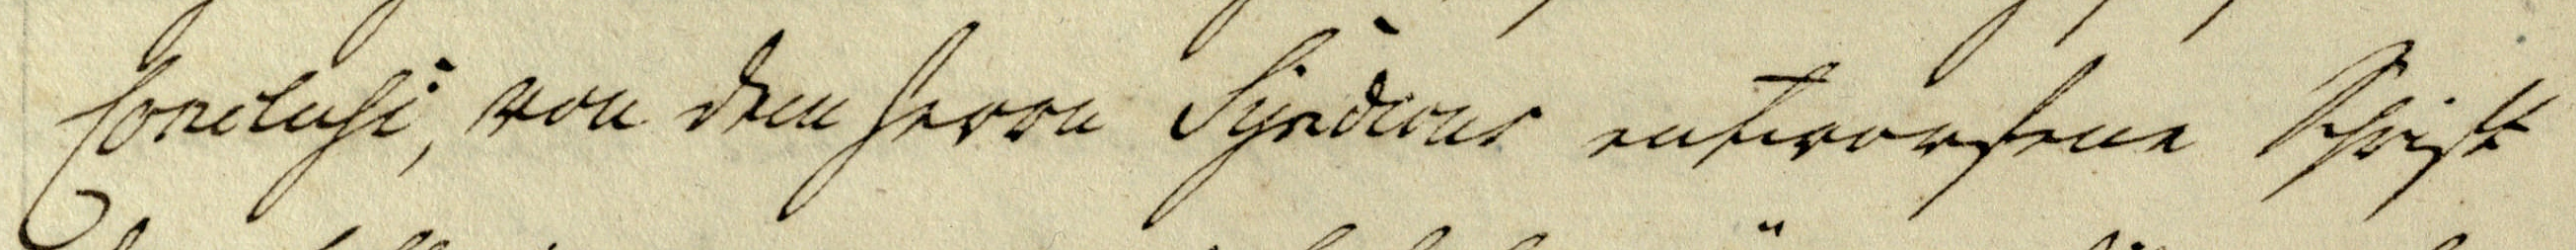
Conclusi, von dem Herrn Sÿndicus entworfene Schrift
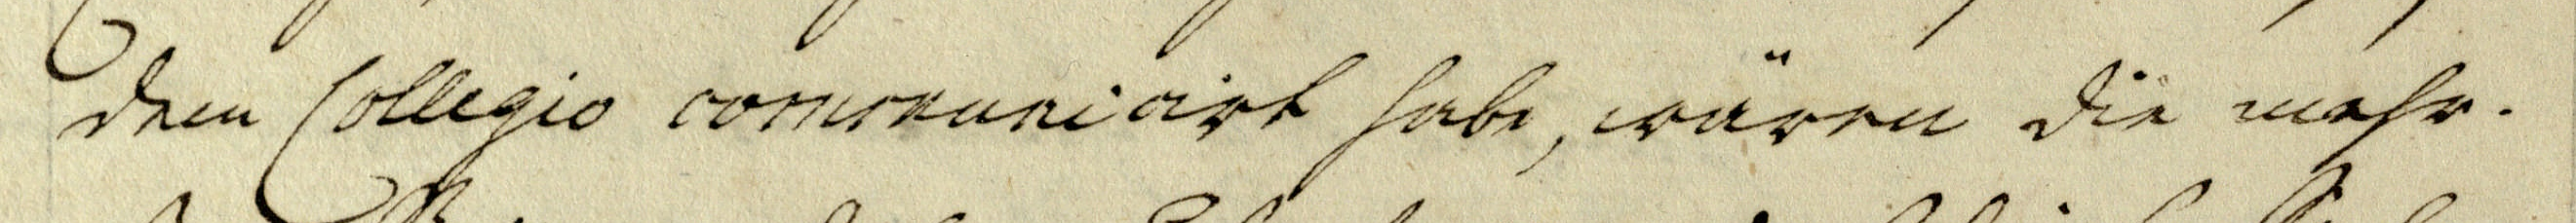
dem Collegio communicirt habe, wären die mehr¬
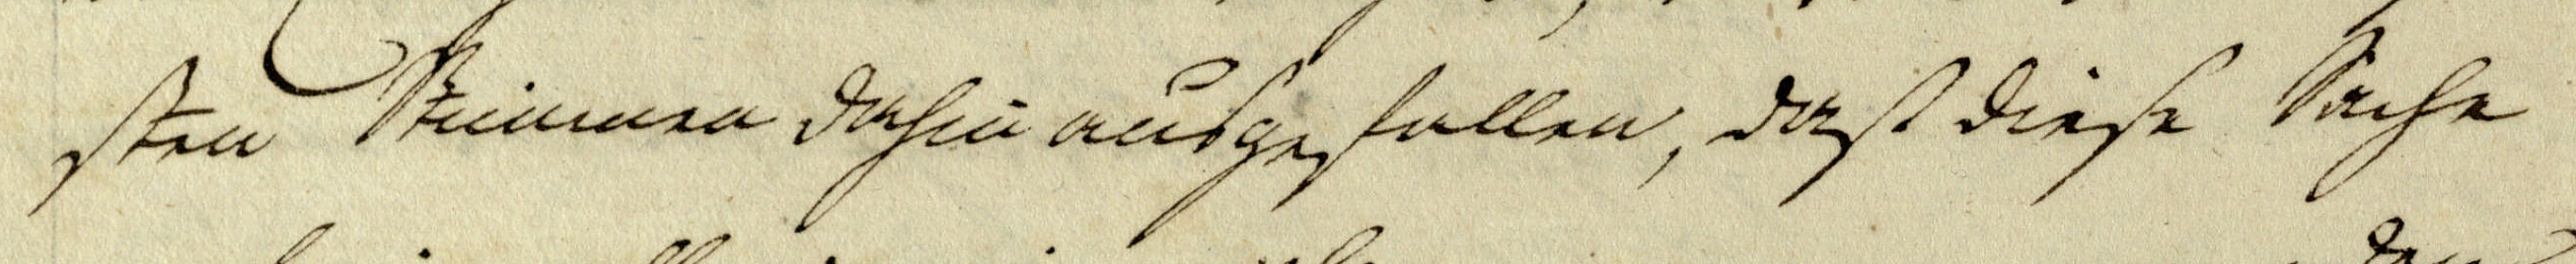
sten Stimmen dahin ausgefallen, daß diese Sache
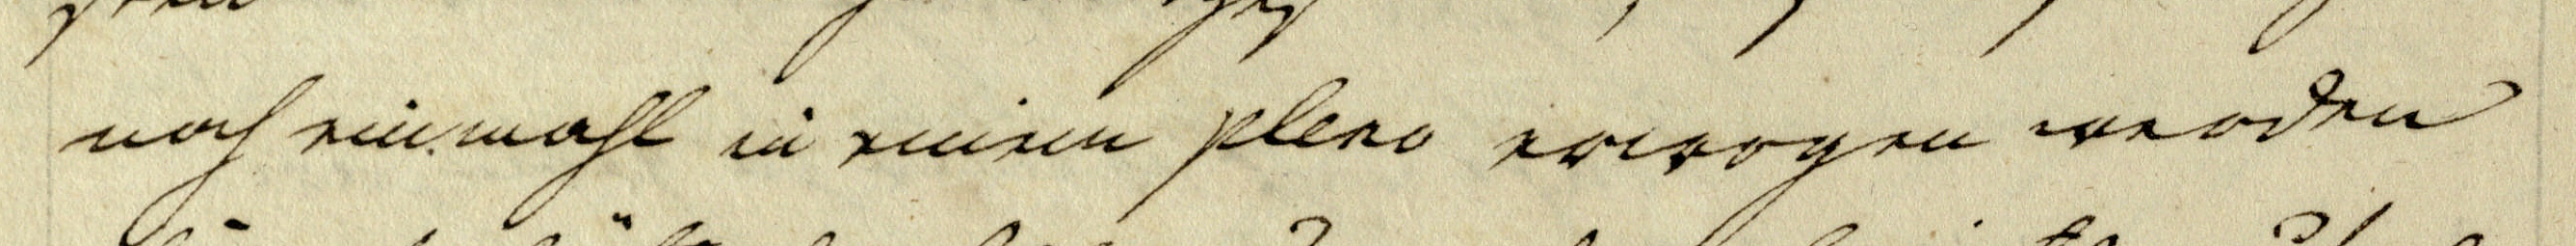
noch einmahl in einem pleno erwogen werden
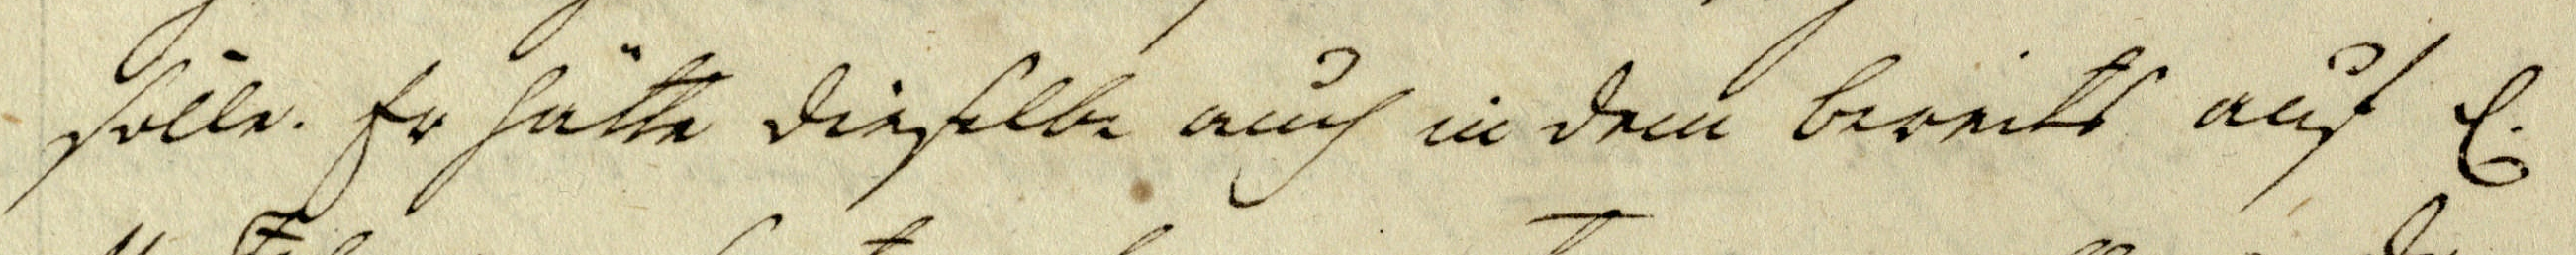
solle. Er hätte dieselbe auch in dem bereits auf d.
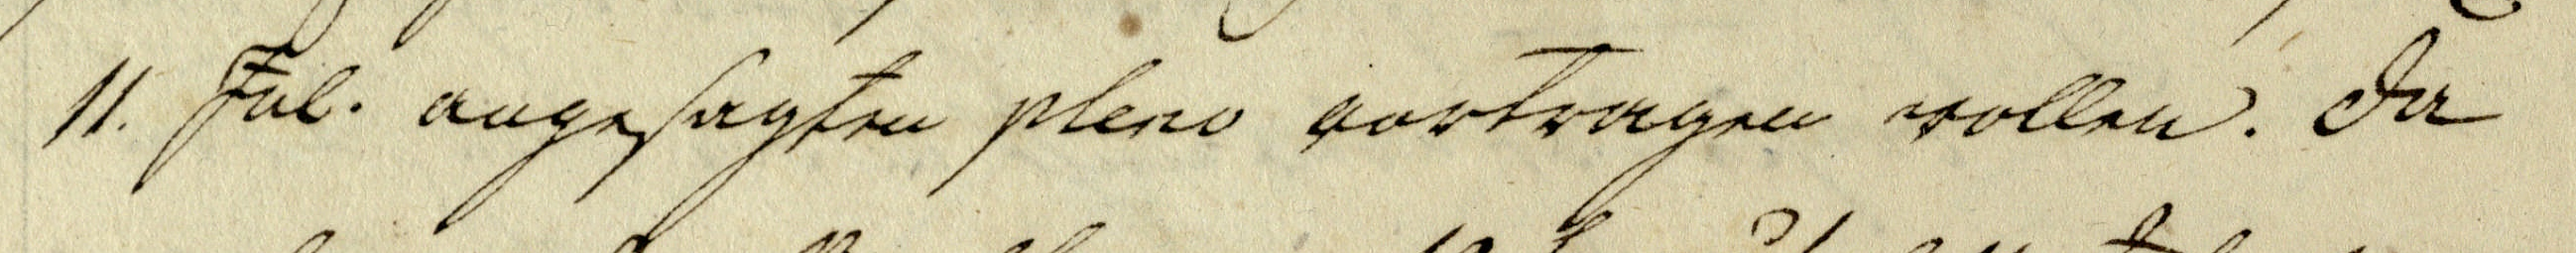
11. Jul. angesagten pleno vortragen wollen. Da
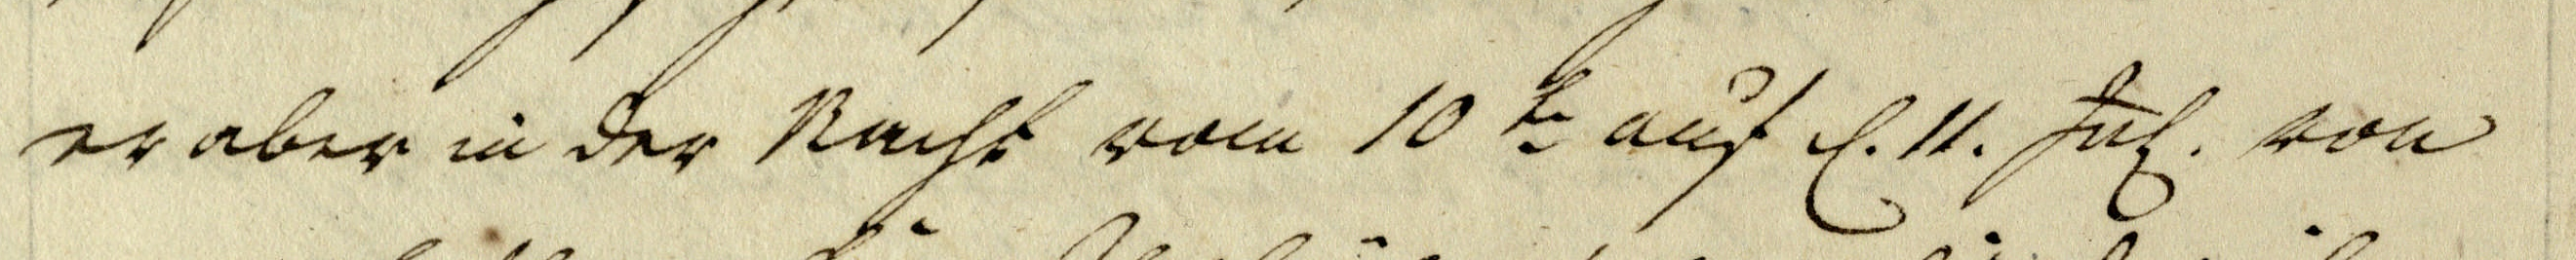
er aber in der Nacht vom 10 t auf d. 11. Jul. von
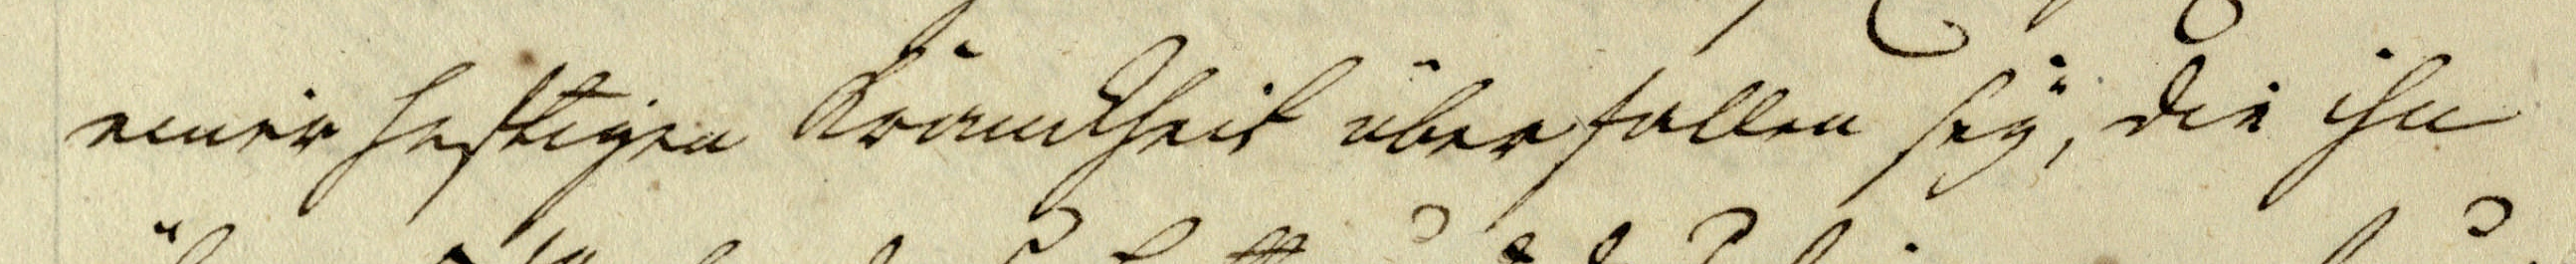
einer heftigen Kranckheit überfallen seÿ, die ihn
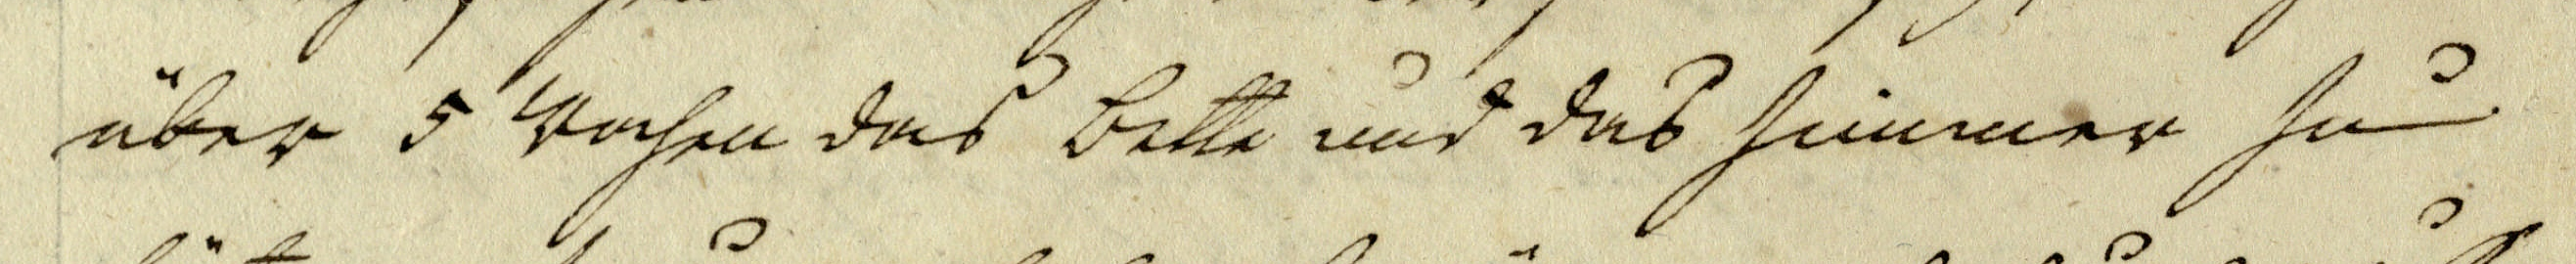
über 5 Wochen das Bette und das Zimmer zu
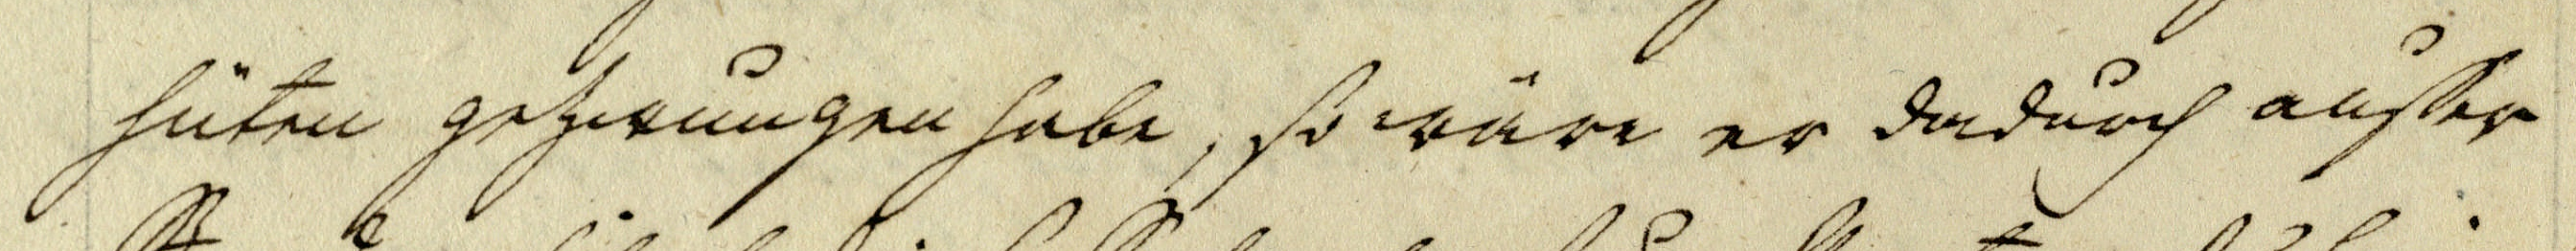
hüten gezwungen habe, so wäre er dadurch ausser
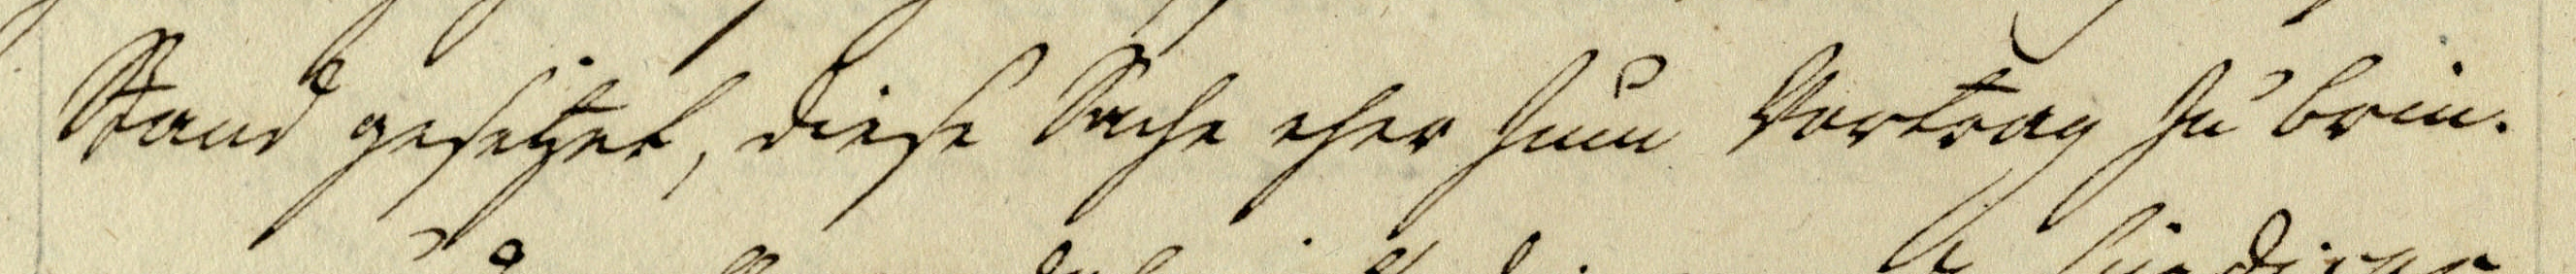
Stand gesetzet, diese Sache eher zum Vortrag zu brin¬
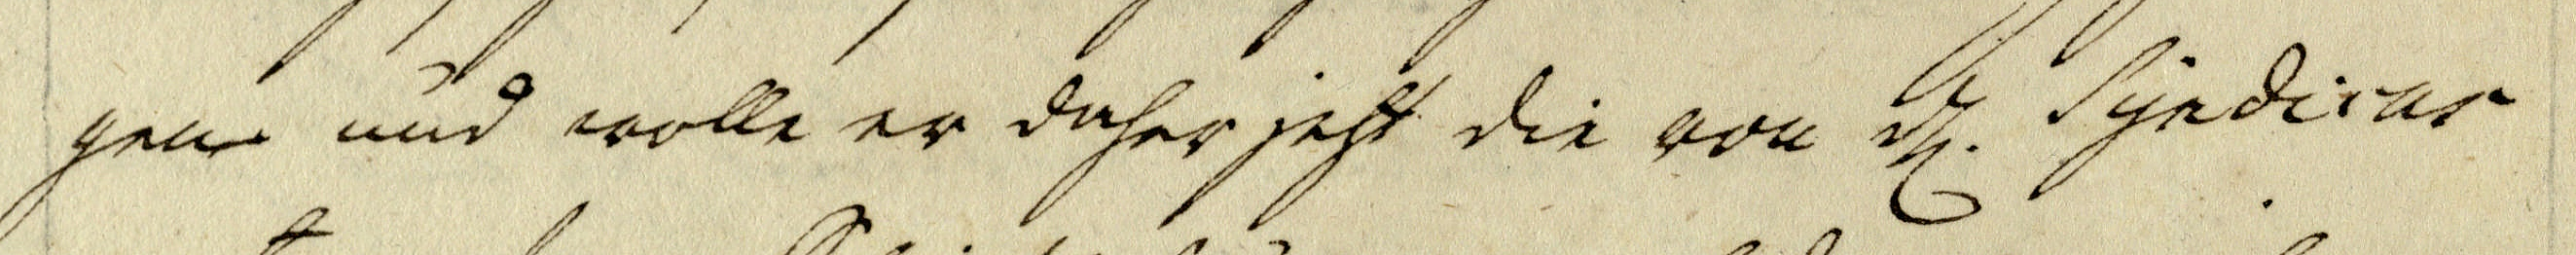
gen und wolle er daher jetzt die von dh. Sÿndicus
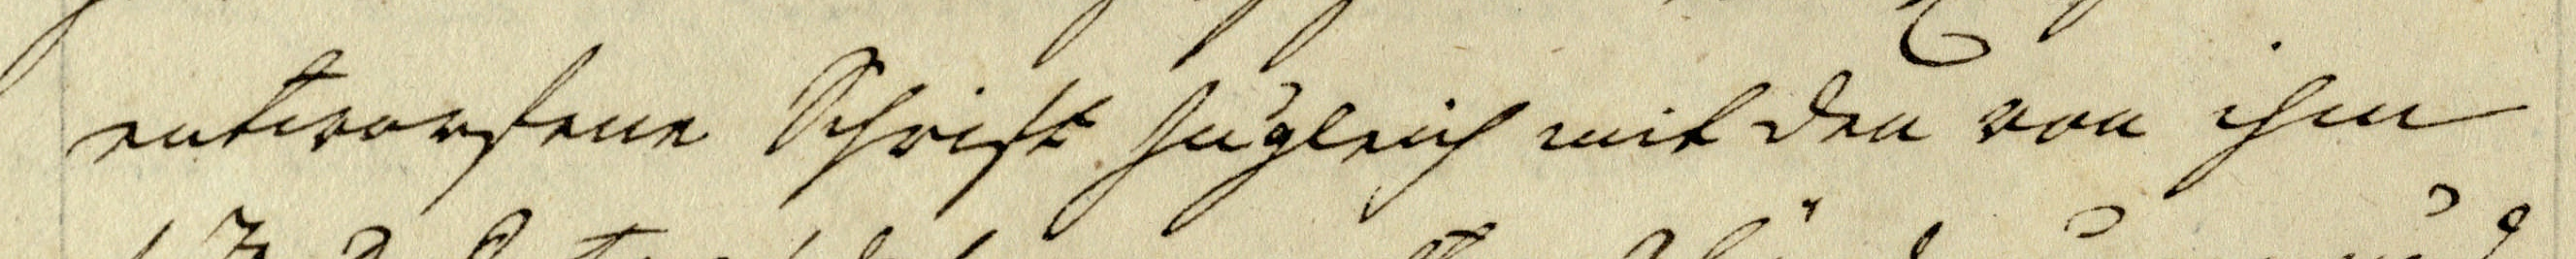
entworfene Schrift zugleich mit den von ihm
